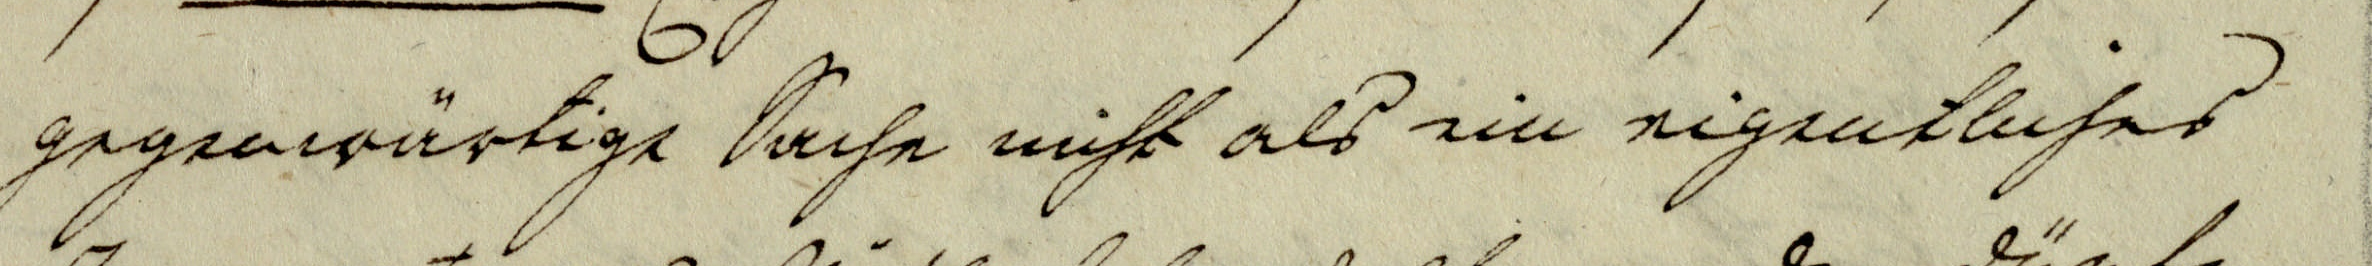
gegenwärtige Sache nicht als ein eigentliches
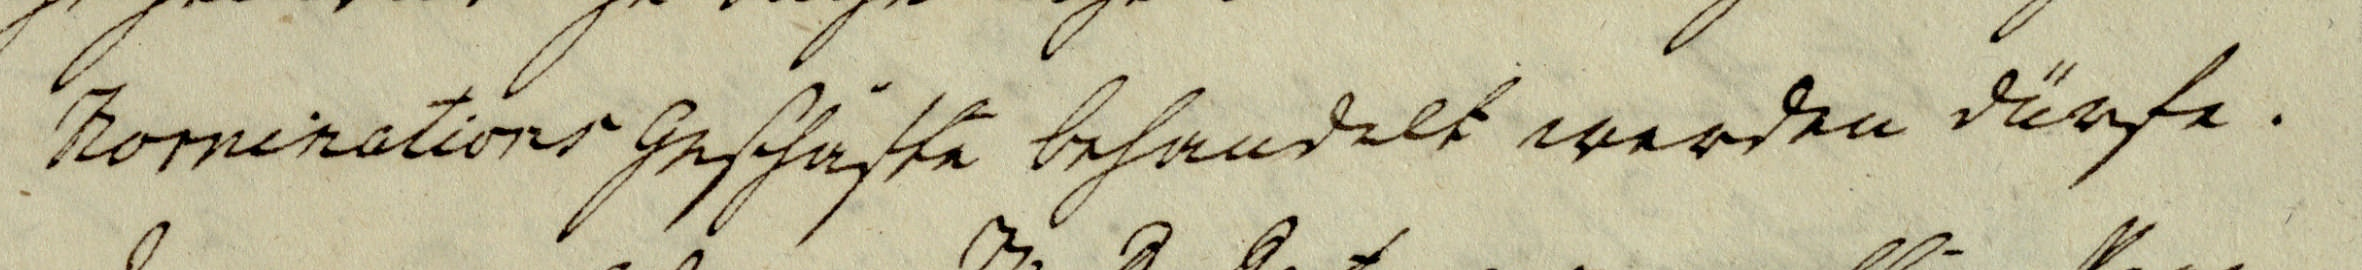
Nominations Geschäfte behandelt werden dürfe.
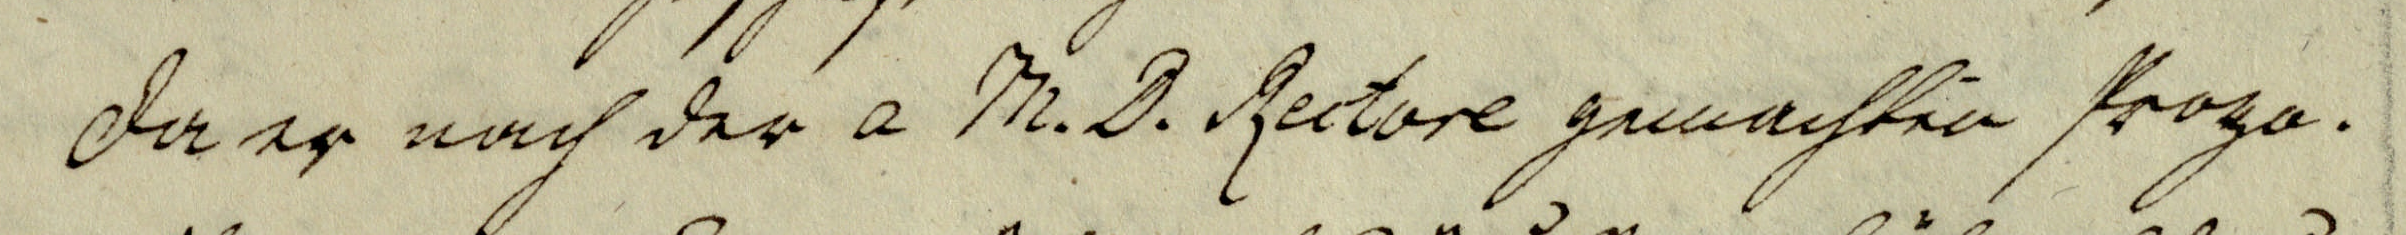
Da er nach der a M. D. Rectore gemachten Propo¬
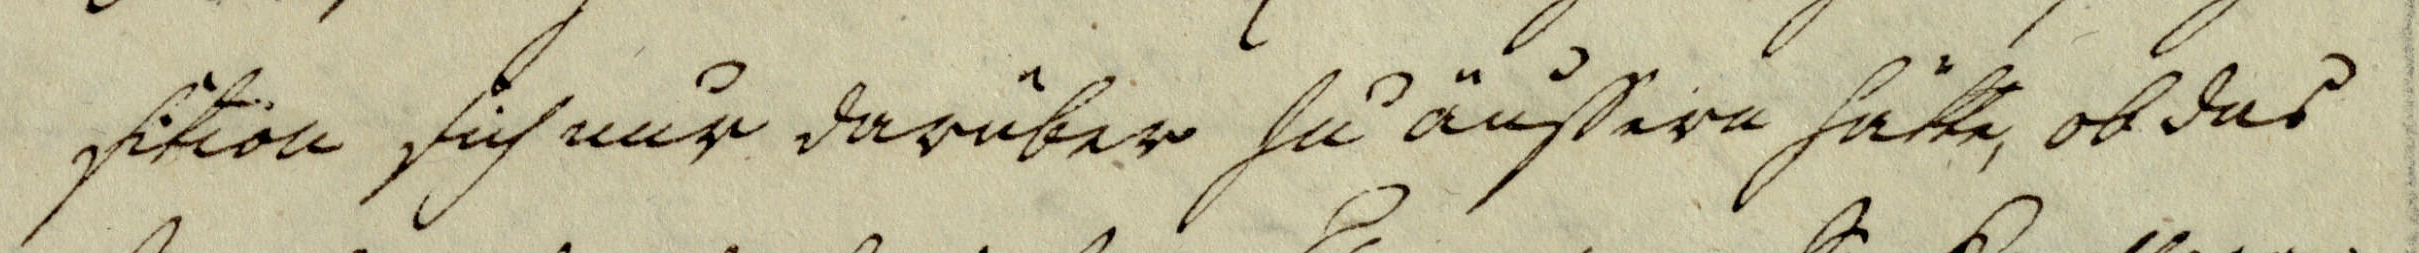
sition sich nur darüber zu äussern hätte, ob das
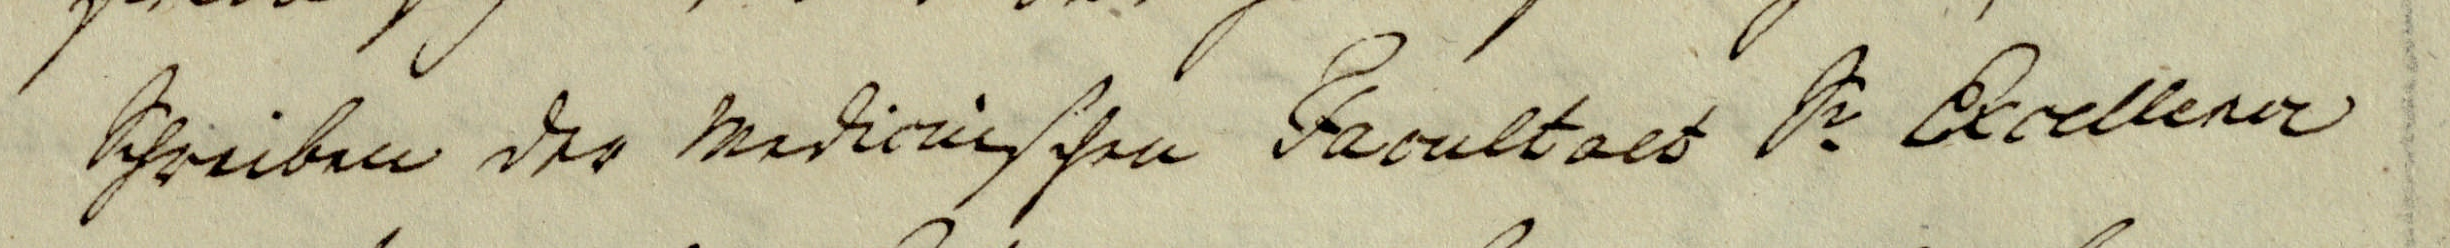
Schreiben der Medicinischen Facultaet Sr Excellence
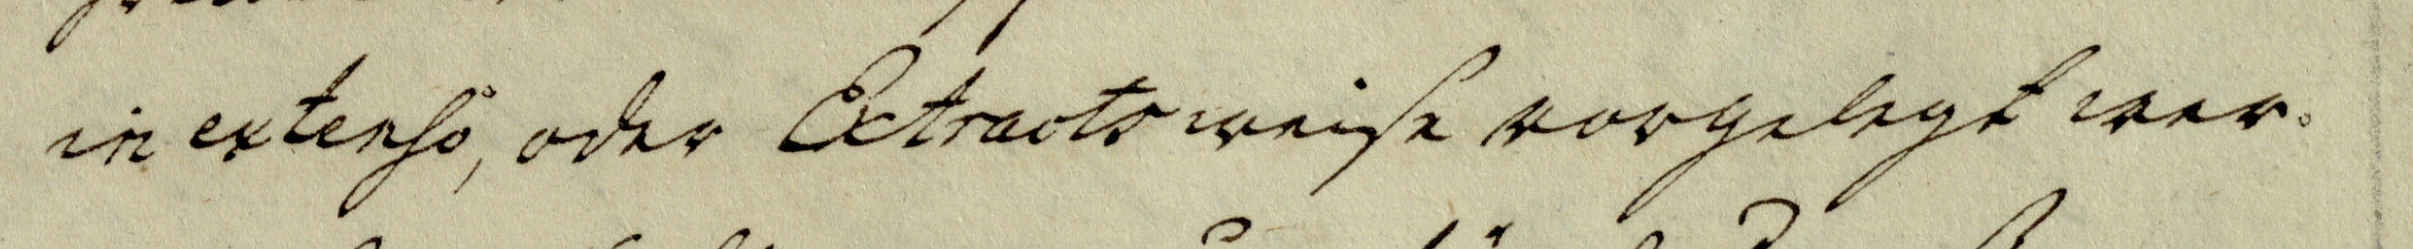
in extenso, oder Extractsweise vorgelegt wer¬
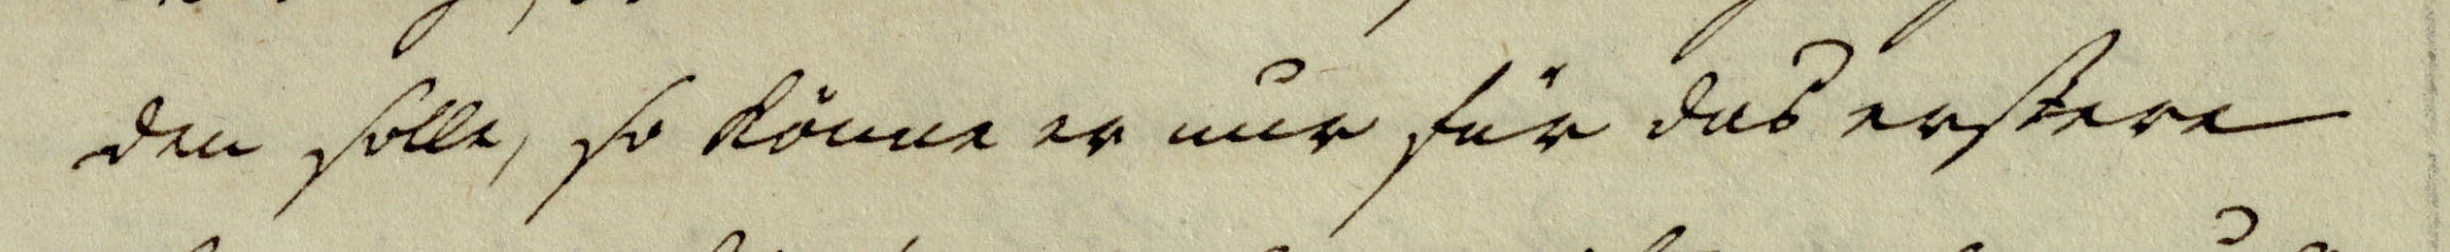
den solle, so könne er nur für das erstere
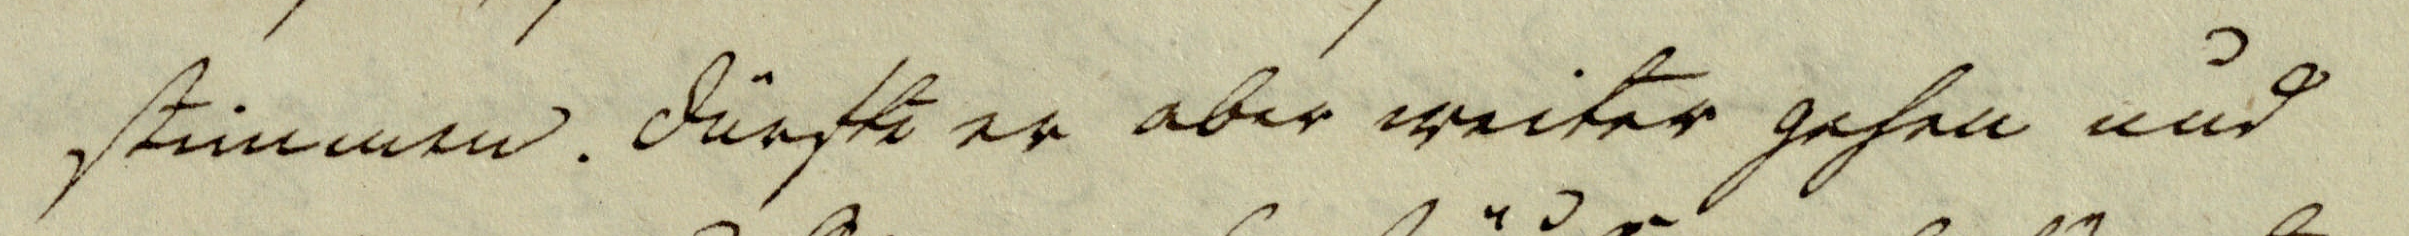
stimmen. Dürfte er aber weiter gehen und
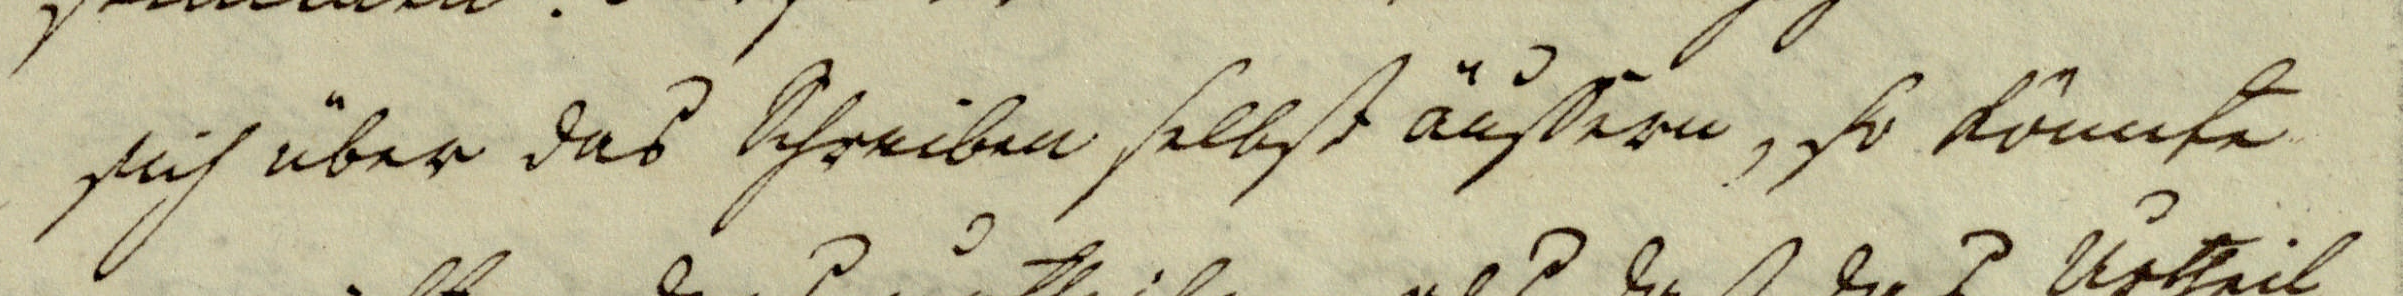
sich über das Schreiben selbst äussern, so könnte
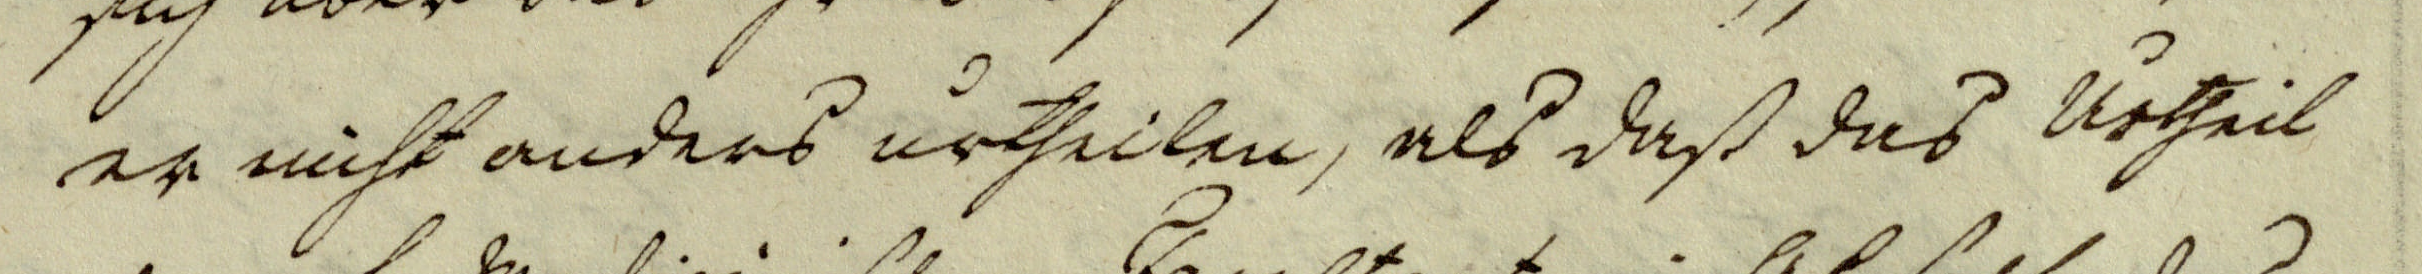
er nicht anders urtheilen, als daß das Urtheil
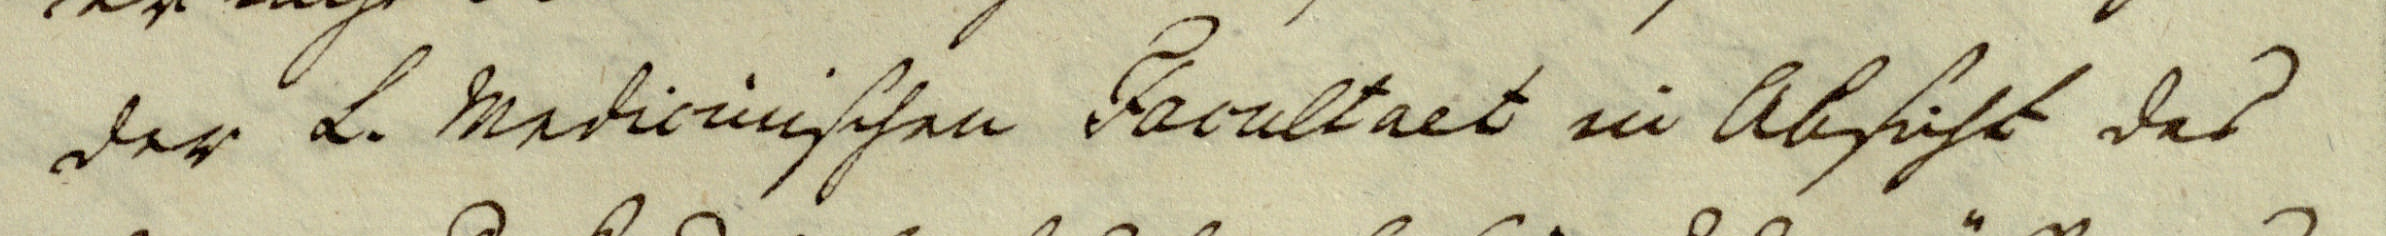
der L. Medicinischen Facultaet in Absicht des
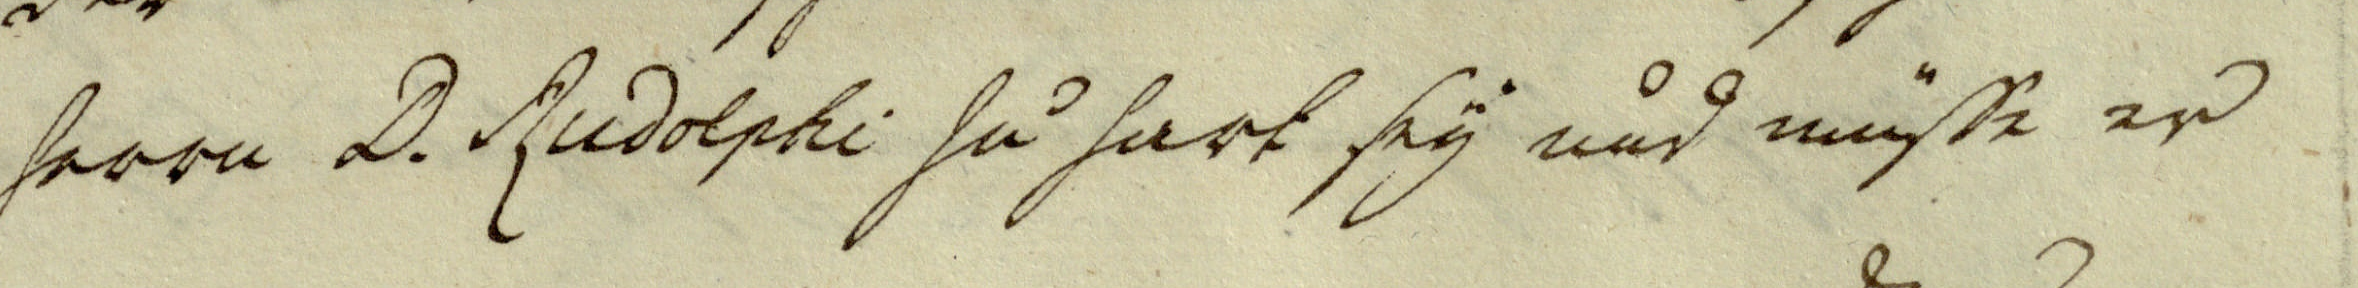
Herrn D. Rudolphi zu hart seÿ und müsse er
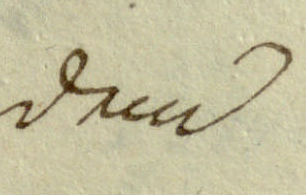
dem
